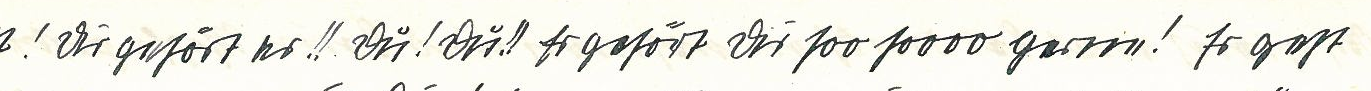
! Dir gehört er!! Du! Du!! Er gehört Dir soo sooo gerne! Er geht
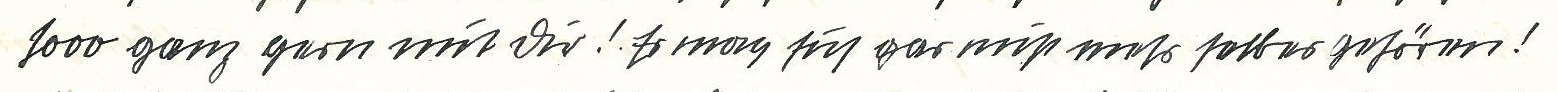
sooo ganz gern mit Dir! Er mag sich gar nicht mehr selber gehören!
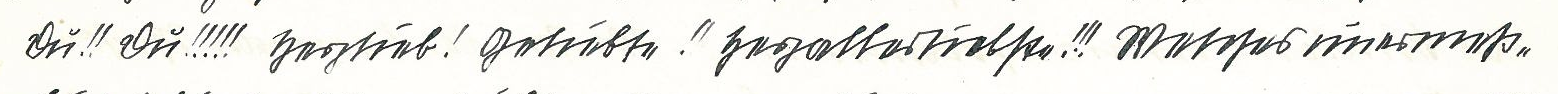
Du!! Du!!!!! Herzlieb! Geliebte!! Herzallerliebste!!! Welches unermeß¬
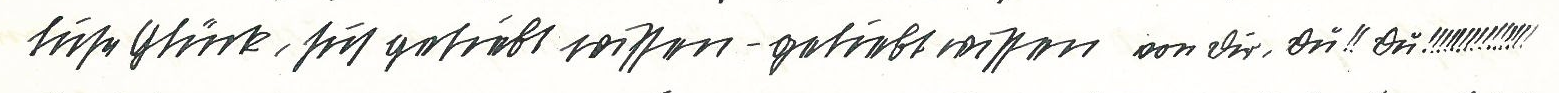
liche Glück, sich geliebt wissen – geliebt wissen von Dir!!!!!!!!!!!!!!!
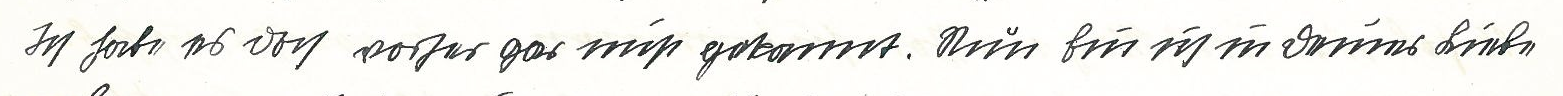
Ich habe es doch vorher gar nicht gekannt. Nun bin ich in Deiner Liebe
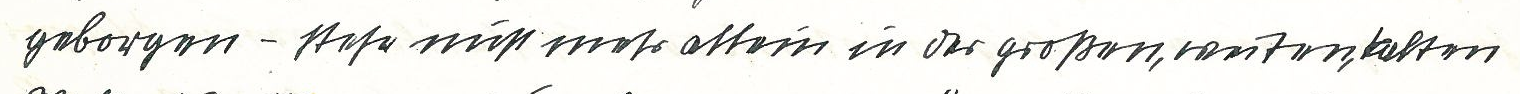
geborgen – stehe nicht mehr allein in der großen, weiten, kalten
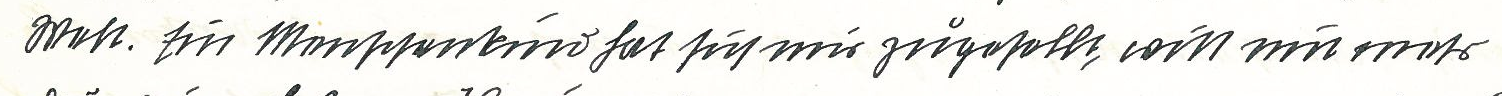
Welt. Ein Menschenkind hat sich mir zugesellt, will mit mehr
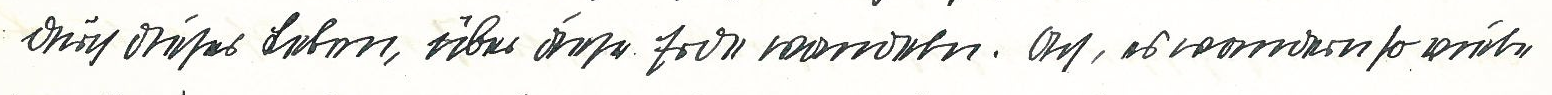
durch dieses Leben, über diese Erde wandeln. Ach, es wandern so viele
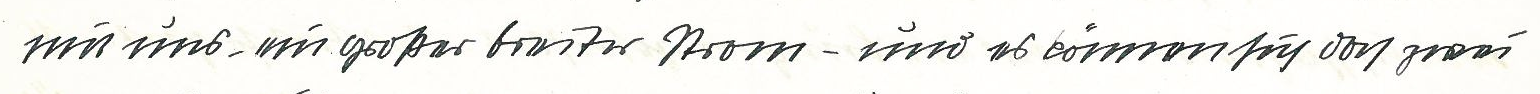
mit uns – ein großer breiter Strom – und es können sich doch zwei
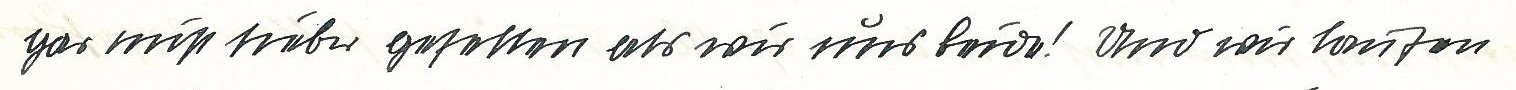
gar nicht lieber gesellen als wir uns beide! Und wir laufen
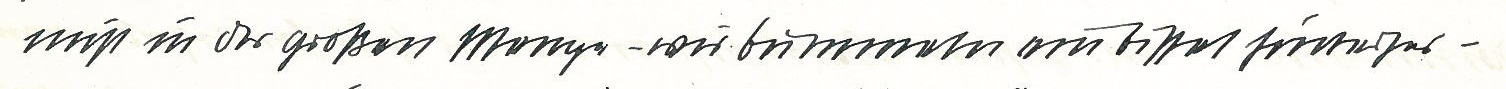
nicht in der großen Menge – wir bummeln ein bissel hinterher –
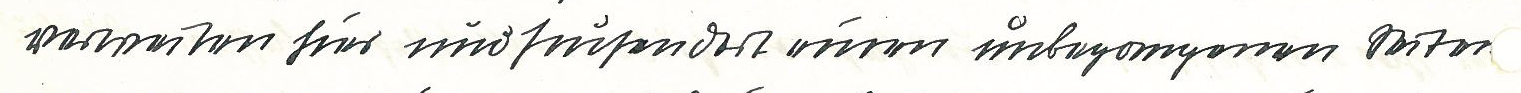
verweilen hier und suchen dort einen unbegangenen Seiten¬
